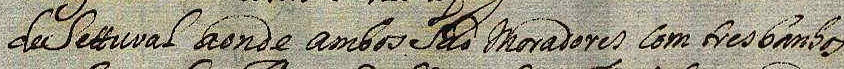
de Settuval aonde ambos saõ moradores, com tres banhos
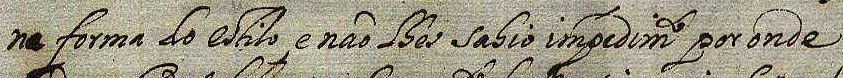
na forma do estilo, e naõ lhes sahio impedimto por onde
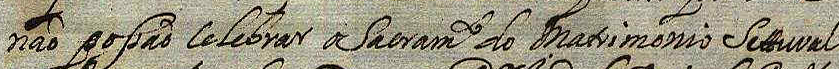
naõ possaõ celebrar o Sacramto do matrimonio Settuval
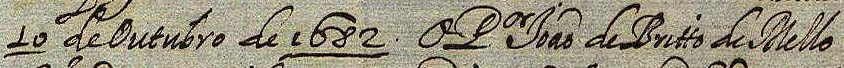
10 de Outubro de 1682. O Por Ioão de Britto de Mello
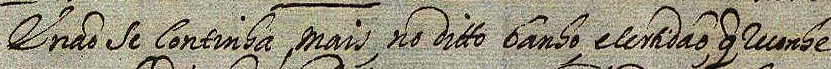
E naõ se continha, mais no ditto banho, e certidaõ, q̄ Reconhe
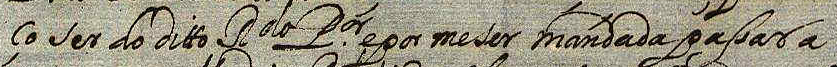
ço ser do ditto Rdo P.or e por me ser mandada passar a
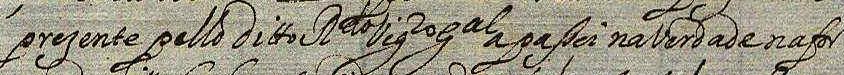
prezente pello ditto Rdo Vigro Gal a passei na verdade na for
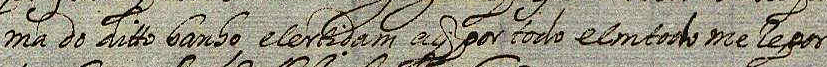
ma do ditto banho, e certidam a q̄ por todo e em todo me Repor
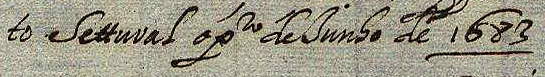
to Settuval o pro de Iunho de 1683
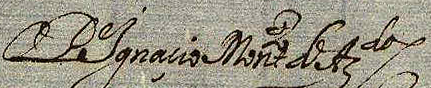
O Pe Ignacio Montro de Azdo
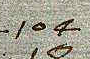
104
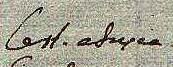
Cert. e busca
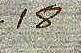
18
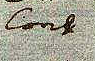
cont
